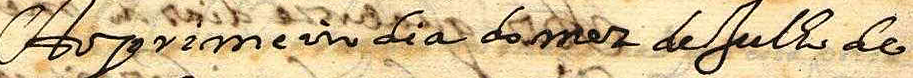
Ao primeiro dia do mez de Julho de
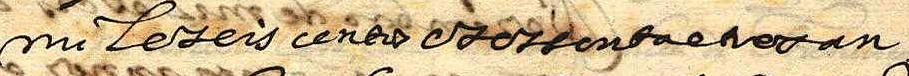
mil e seiscentos e sessenta e tres an
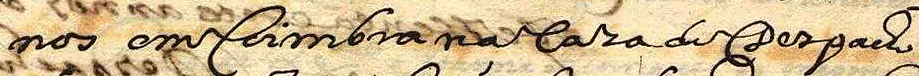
nos em Coimbra na Caza do Despacho
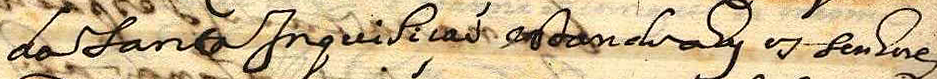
da Santa JnquiSiçaõ estando ahy os senhores
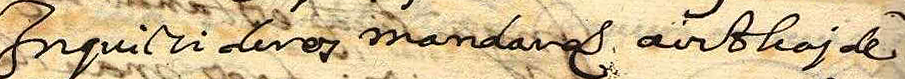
Jnquizidores mandaraõ ao Alcajde
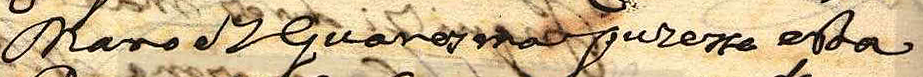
Manoel Quaresma puzesse esta
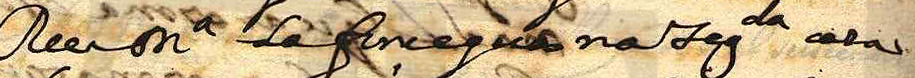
Ree Ma da foncequa na segda casa
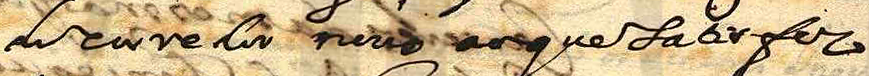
do corredor nouo ao que satisfez
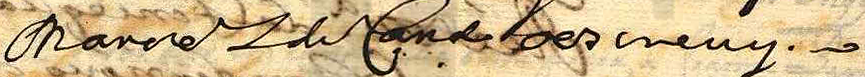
ManoeL do Canto o escreuy.
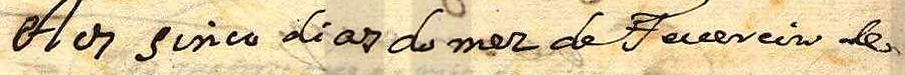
Aos sinco dias do mez de Feuereiro de
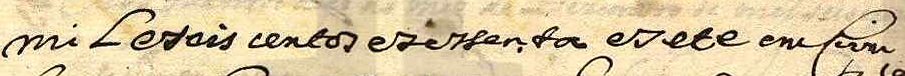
mil e seiscentos e sessenta e sete em Coim
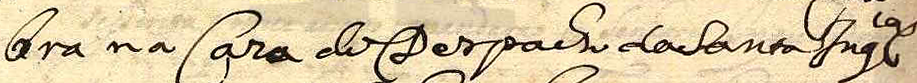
bra na Caza do Despacho da Santa Jnqçaõ
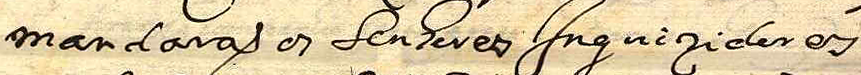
mandaraõ os Senhores Jnquizidores
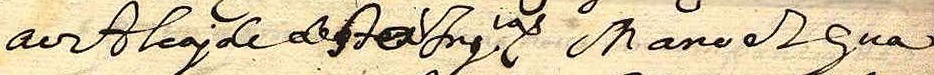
ao Alcajde desta Jnqçaõ Manoel Qua
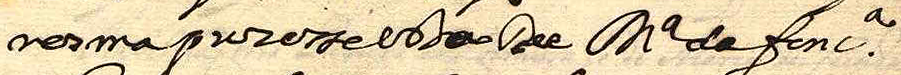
resma puzesse esta Ree Ma da fonc.a
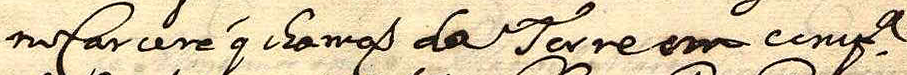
no Carcere q̄ chamaõ da Torre em comp.a
